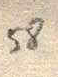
58
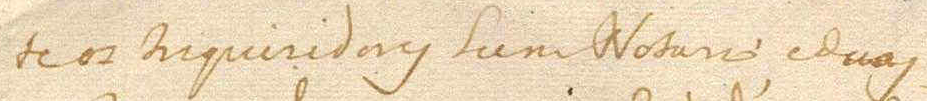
te os Inquizidores hum Notario, e duas
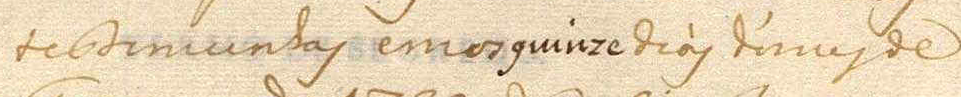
testemunhas em os quinze dias do mes de
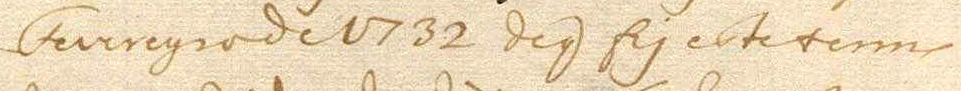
Fevereyro de 1732 de q̄ fis este termo
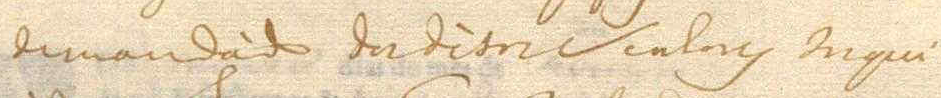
de mandàdo dos dìtos Senhores Inqui
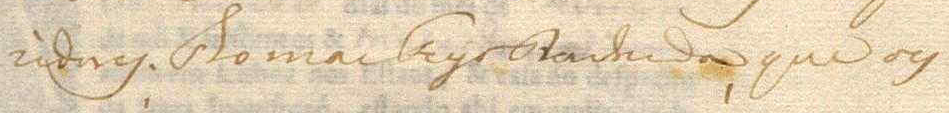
zidores. Thomas Feyo Barbuda, que o es
